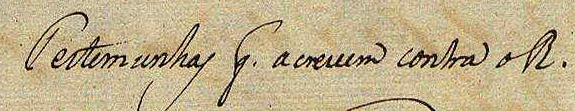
Testemunhas q̄ acressem contra o R.
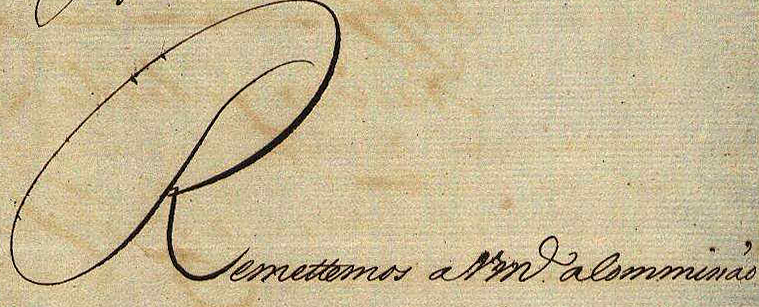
Remettemos a Vm.e a commissão
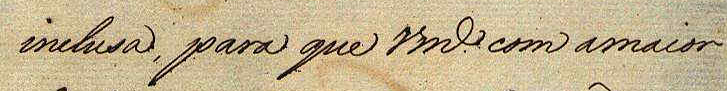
inclusa, para que vm.e com a maior
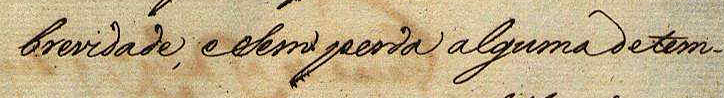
brevidade, e sem perda alguma de tem
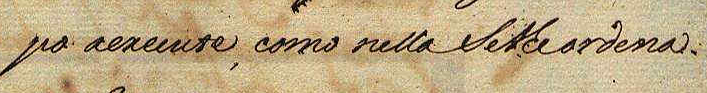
po a execute, como nella Se lhe ordena.
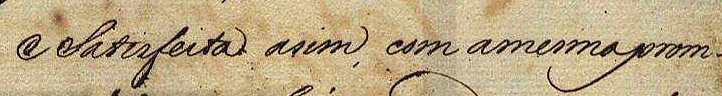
e Satisfeita asim com a mesma prom
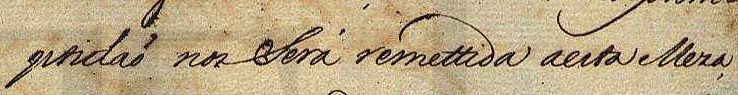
ptidaõ nos Será remettida a esta Meza,
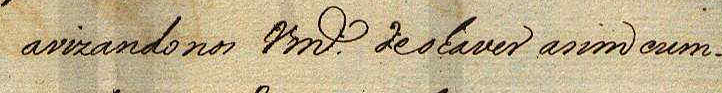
avizandonos Vm.e de o haver asim cum
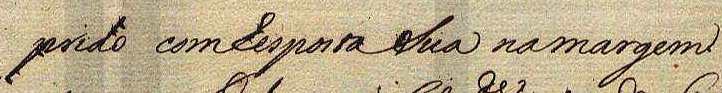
prido com Resposta Sua na margem
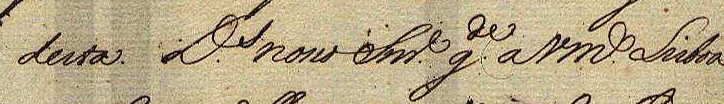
desta. D.s nosso Snr̄. g.de a VM.e Lisboa
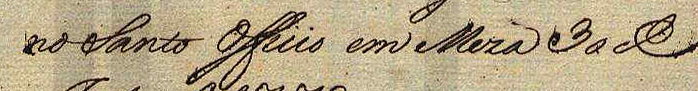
no Santo Officio em Meza 30 d̄
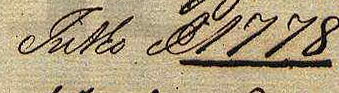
Iulho d̄ 1778
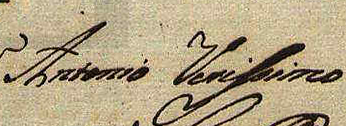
Antonio Verissimo
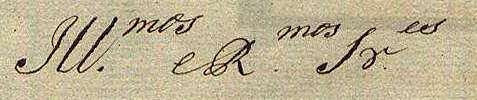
Ill.mos e Rmos Sr.es
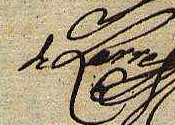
de Larre
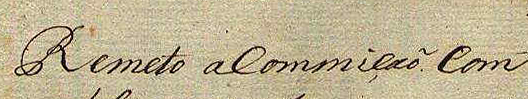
Remeto a Commiçaõ com
